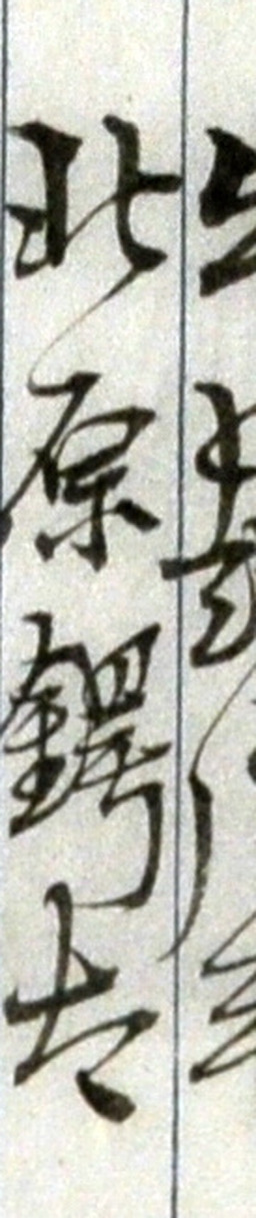北原鍔太
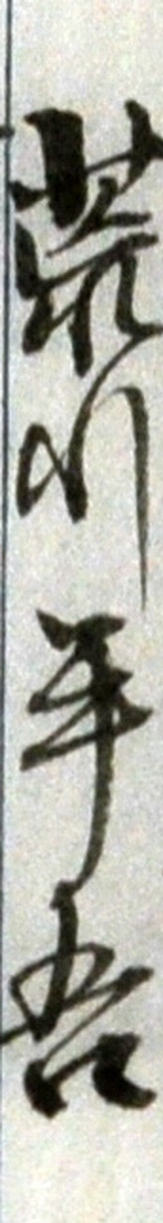荒川平吾
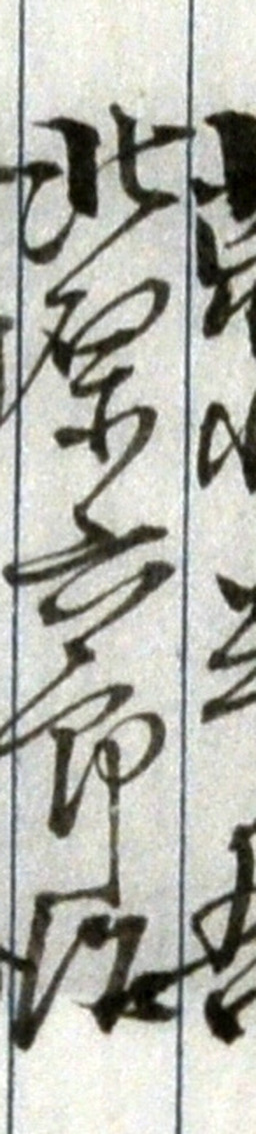北原六郎治
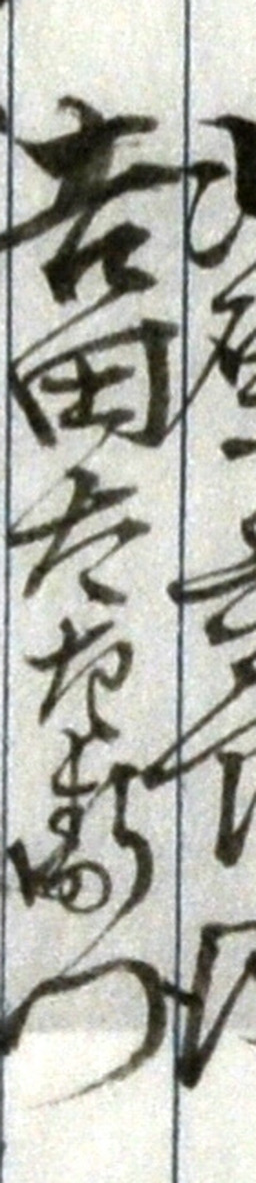吉田太左衛門
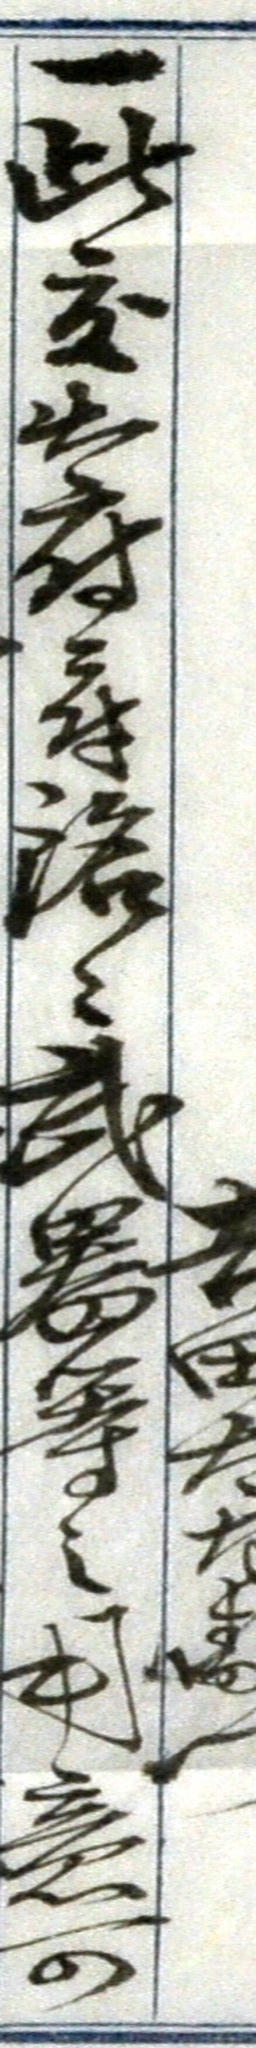一此度出府に付銘々武器等之用意可
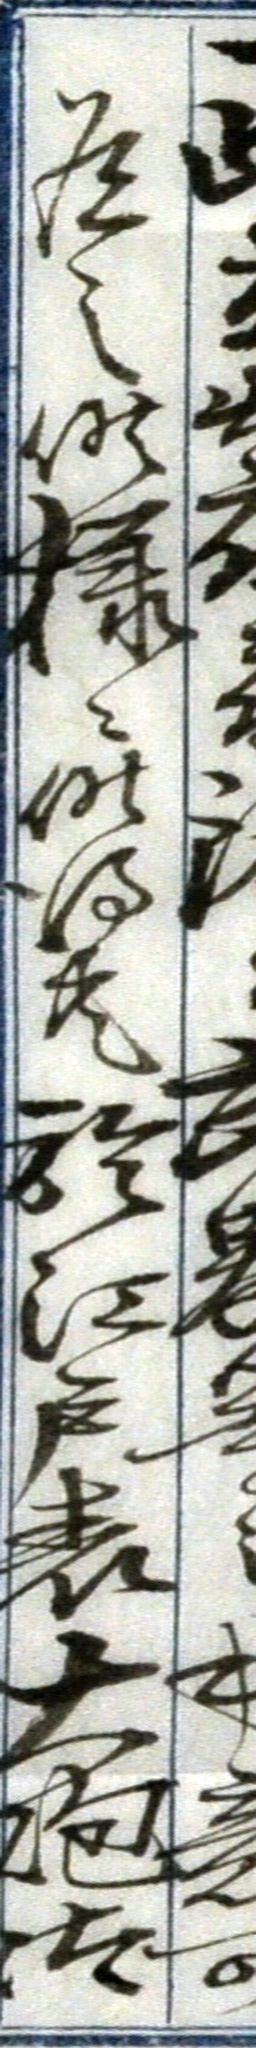有之候様に候得共於江戸表大砲御
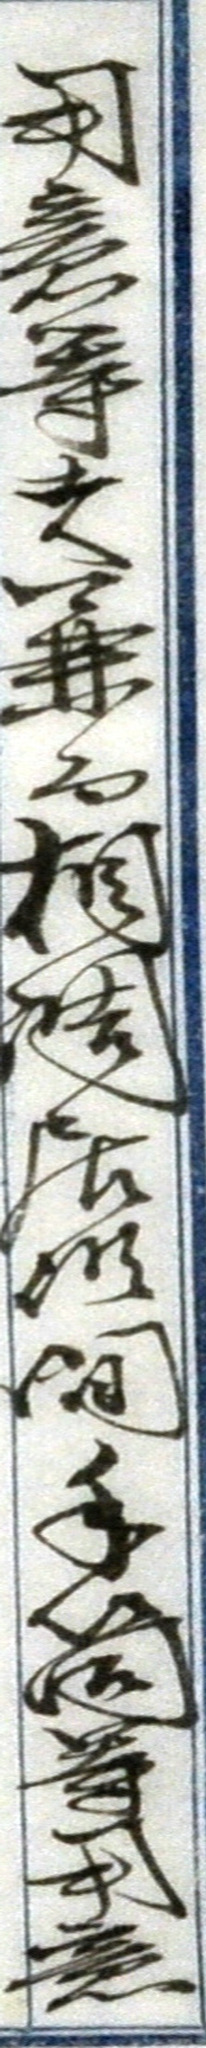用意等は兼て相調居候間手筒等用意
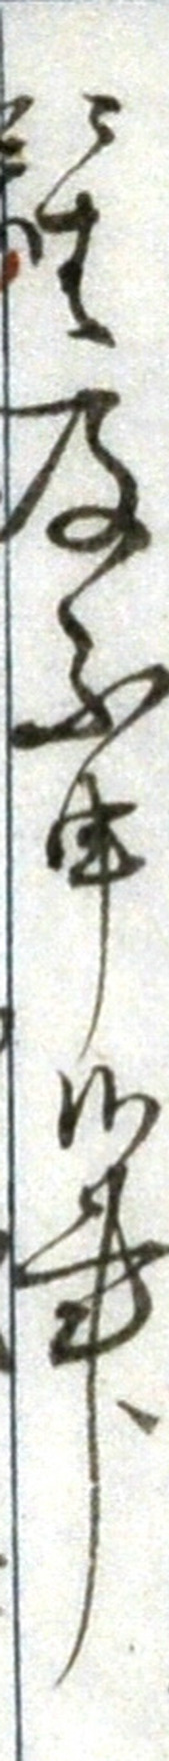には及不申候事
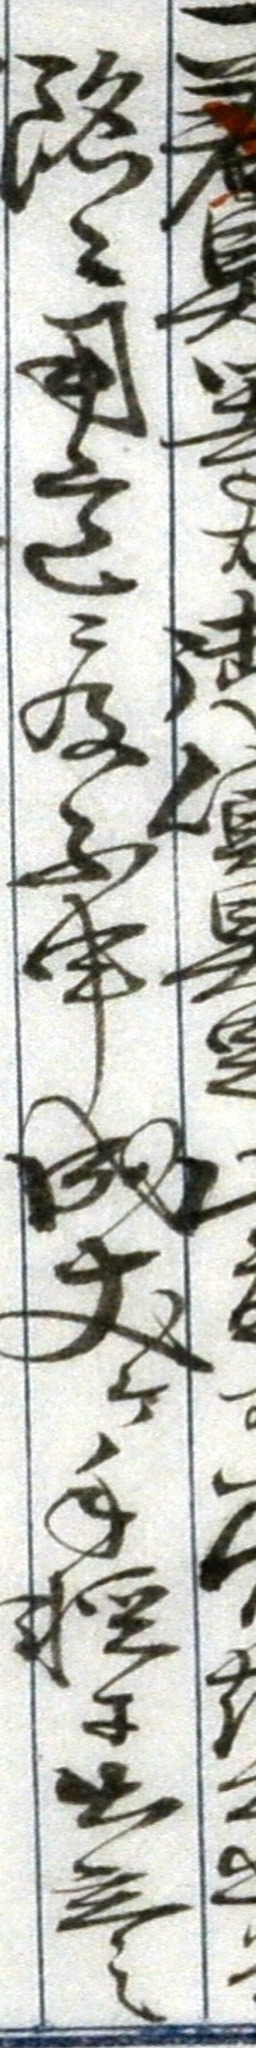銘々用意に及不申成丈ケ手軽に出立之
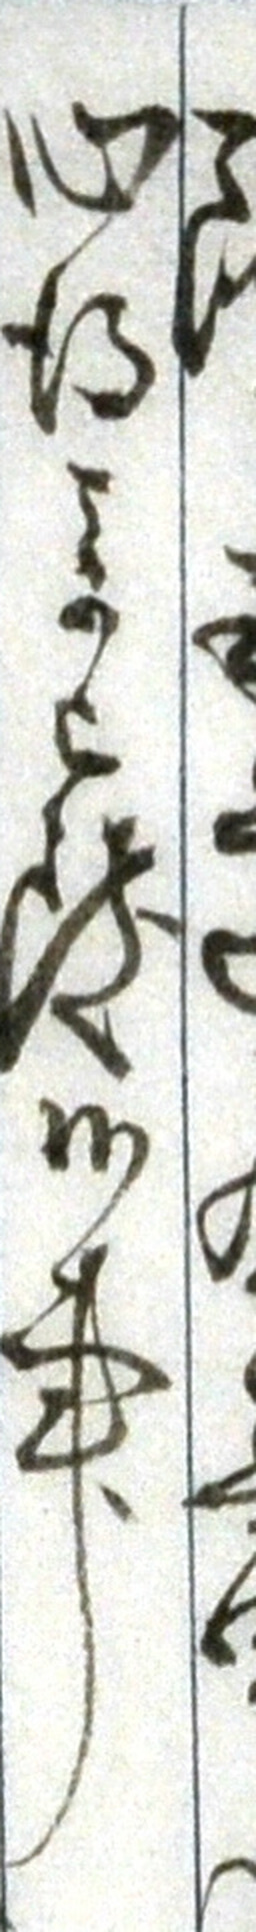心得に可被致候事
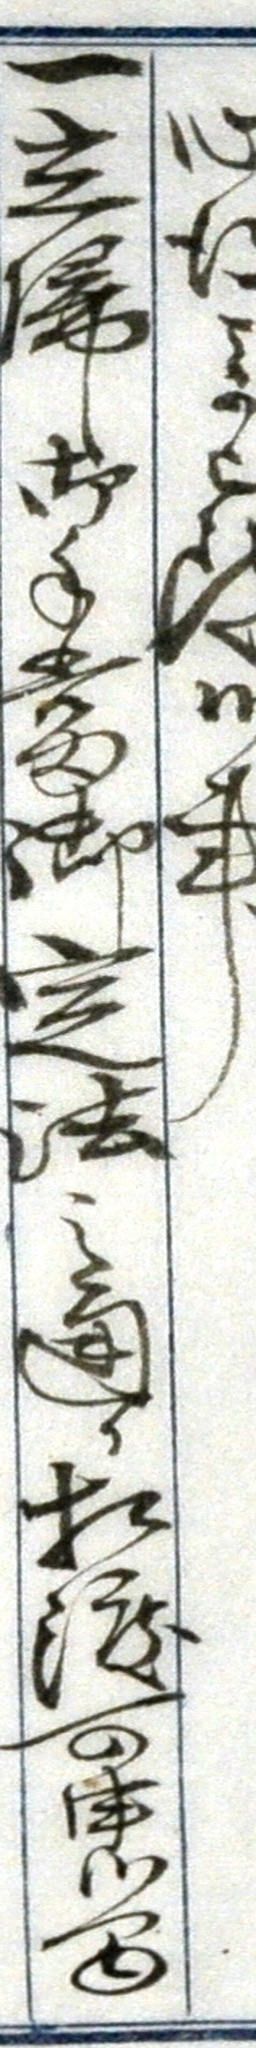一立帰御手当御定法之通り相渡可申候間
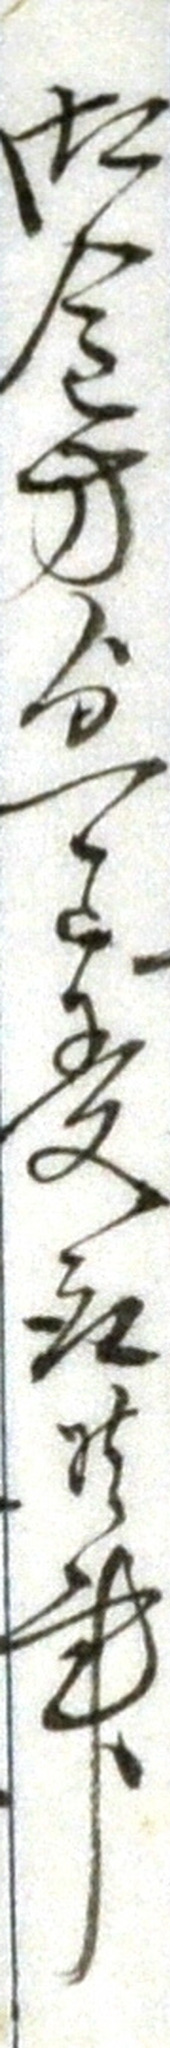御金方ゟ可被受取候事
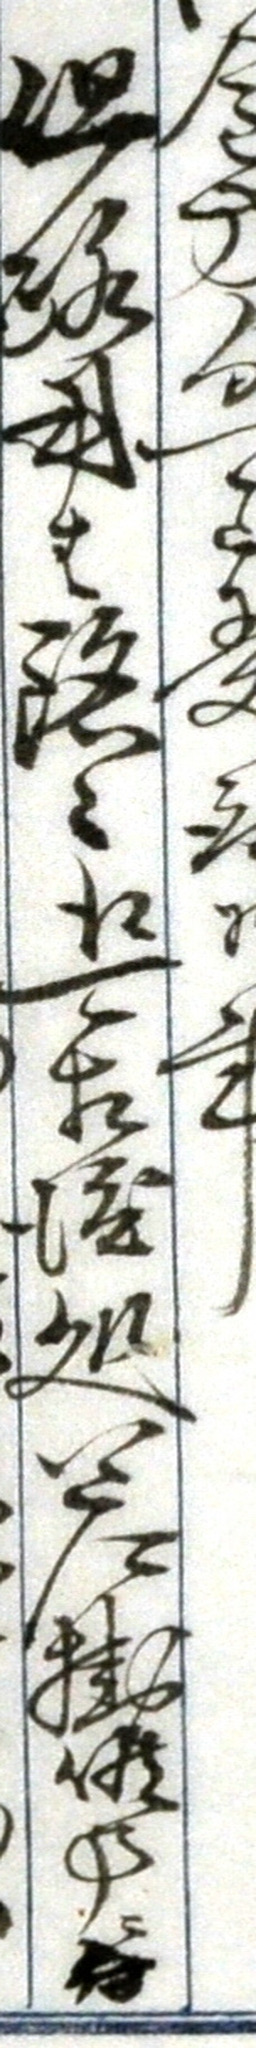但路用は銘々え可相渡処差掛候事に付
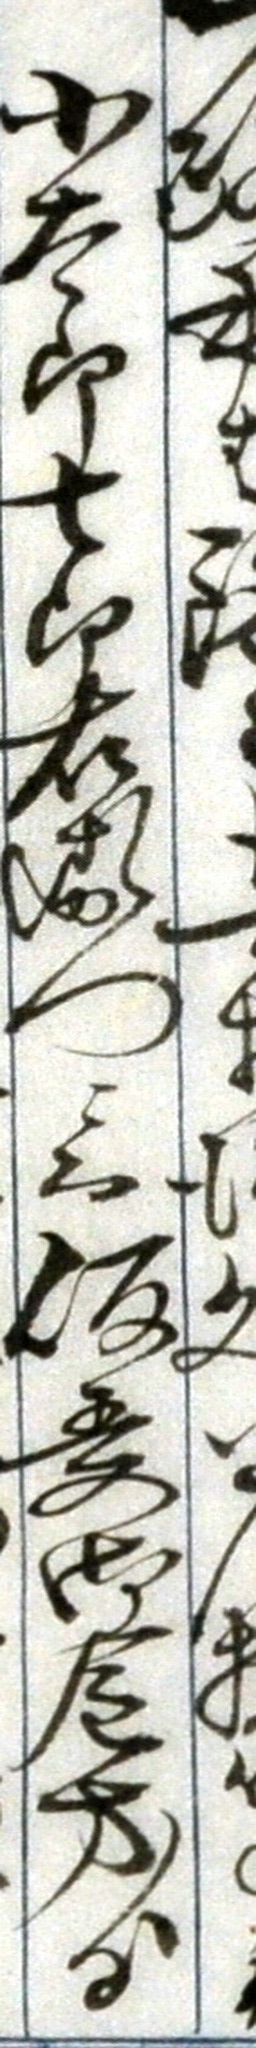小太郎七郎右衛門に而仮受御金方ゟ
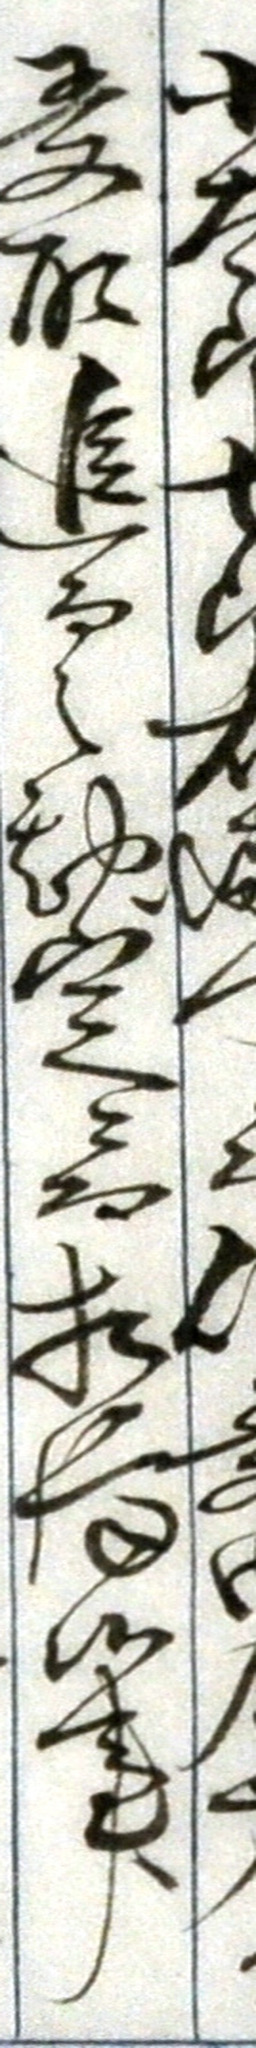受取追而之勘定に而相済候事
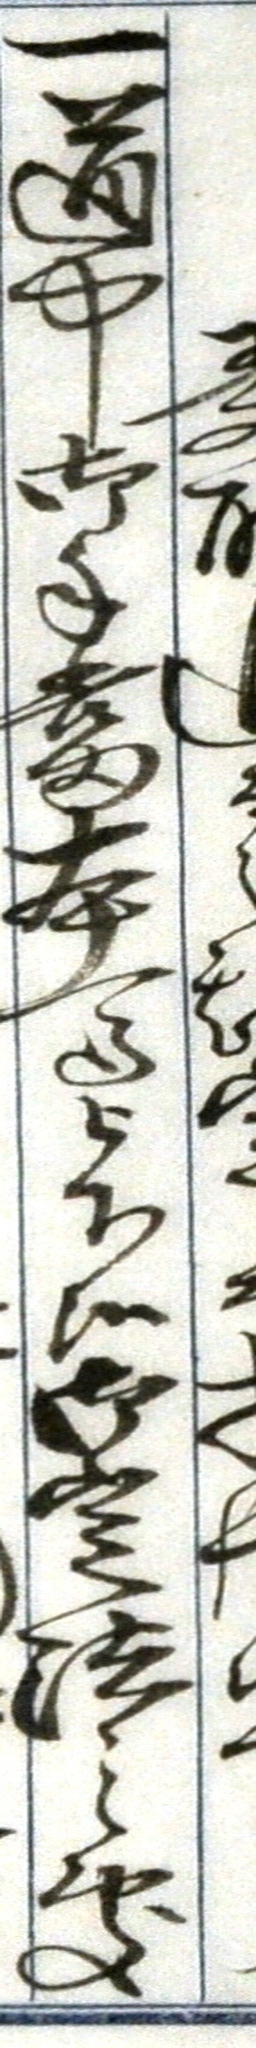一道中御手当本高被下候御定法之処
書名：異国船相州浦賀ニ相見エ候節大目付ヘ被仰出候覚書
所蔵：伊那市立高遠町図書館・合同会社AMANE
